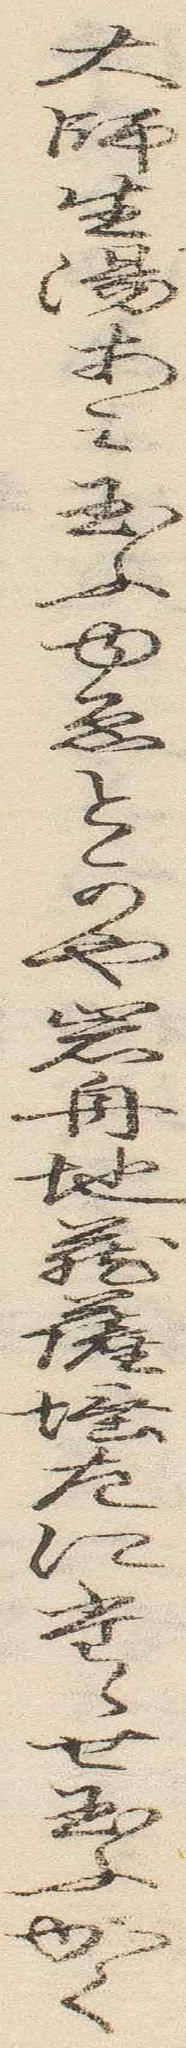大師生湯あみ玉ふゆゑとかや岩舟地蔵薩埵左にたらせ玉ふかく
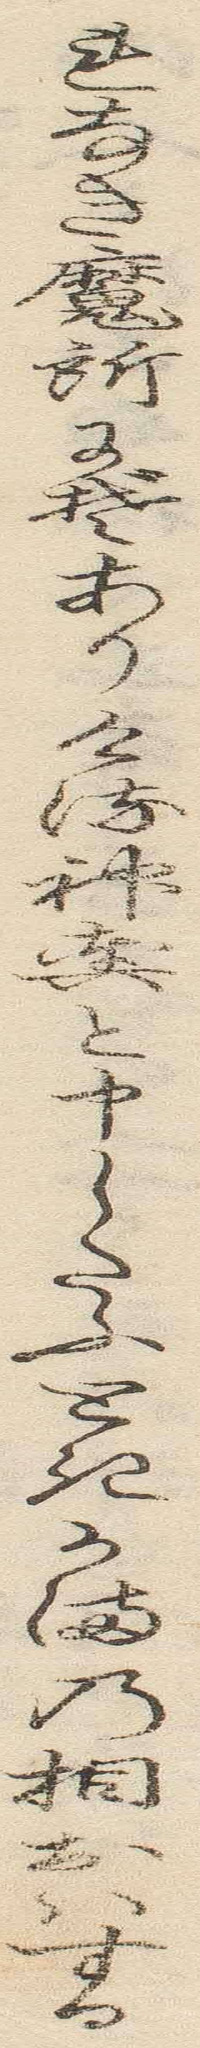れなき魔所にぞありける神輿と申したふときかまの相おはする
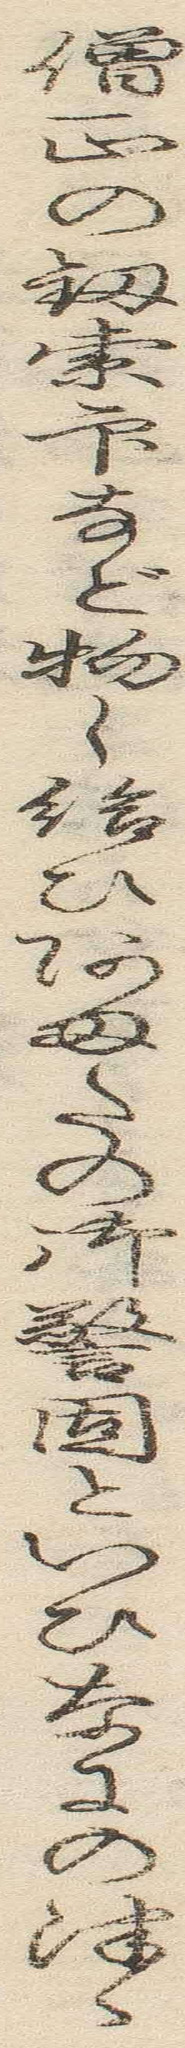僧正の釼索印など物し給ひあまたの御警固といひなにのつゝ
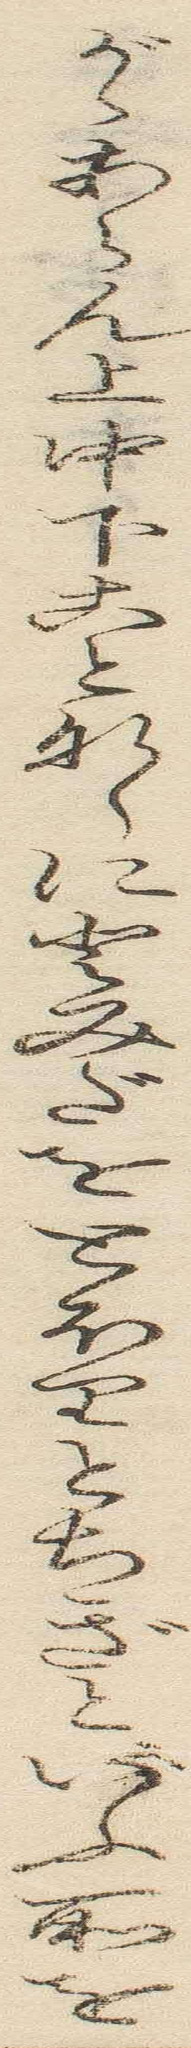がらあらん上中下ことなくにとみだをとほりとちぎといふ所を
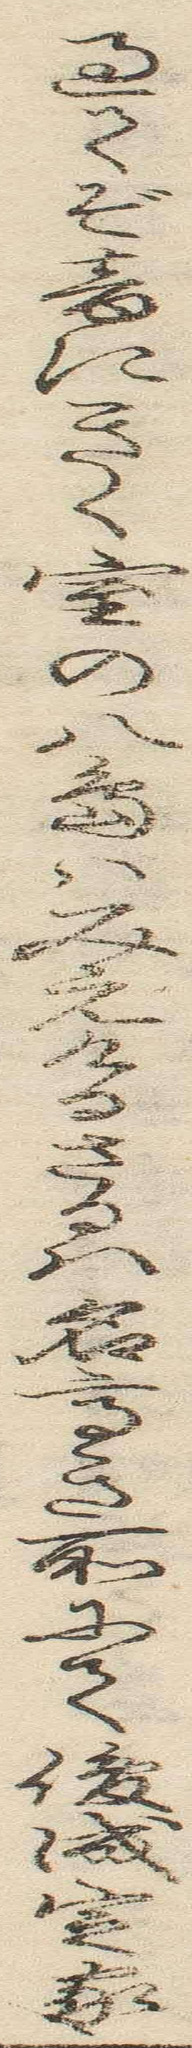過てぞ音にきく室の八島はみえけるさるは名高き所にて俊成定家
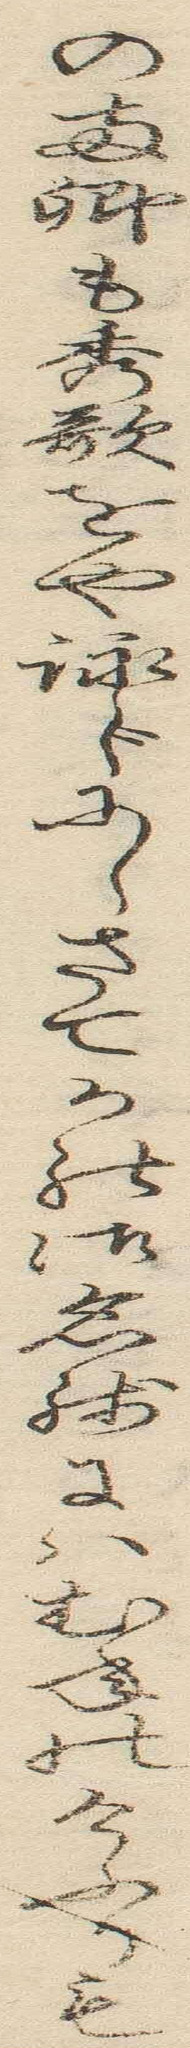の両卿も秀歌をや詠じにしさてかの御名残にはむねのけふりも
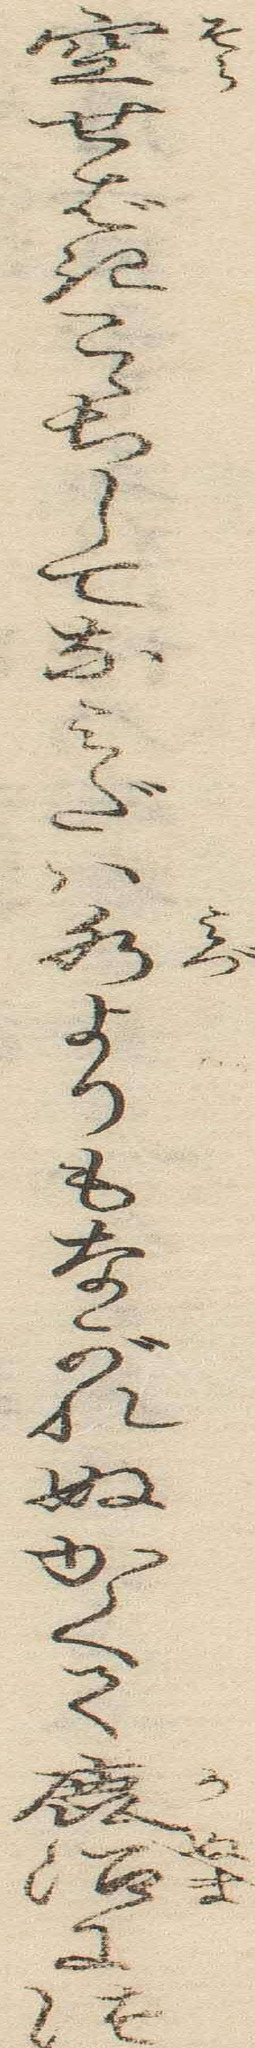空せばきこゝちしてなみだは水よりもながれぬかくて鹿沼につ
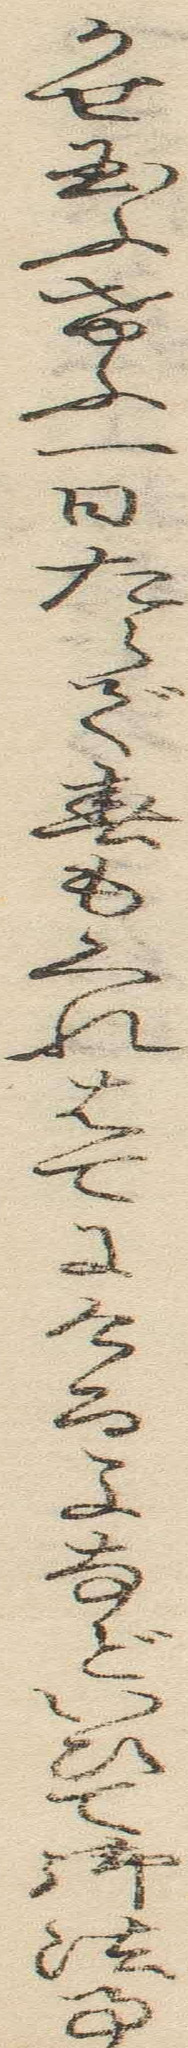かせ玉ふけふ一日たらで春もくれはてにけるよなどいひて御法事
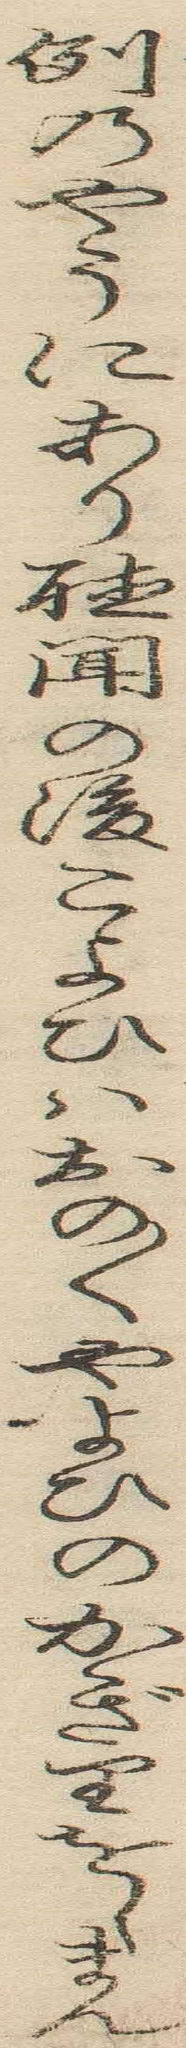例のやうにあり聴聞の後こよひはおの〳〵やよひのかぎりをしまん

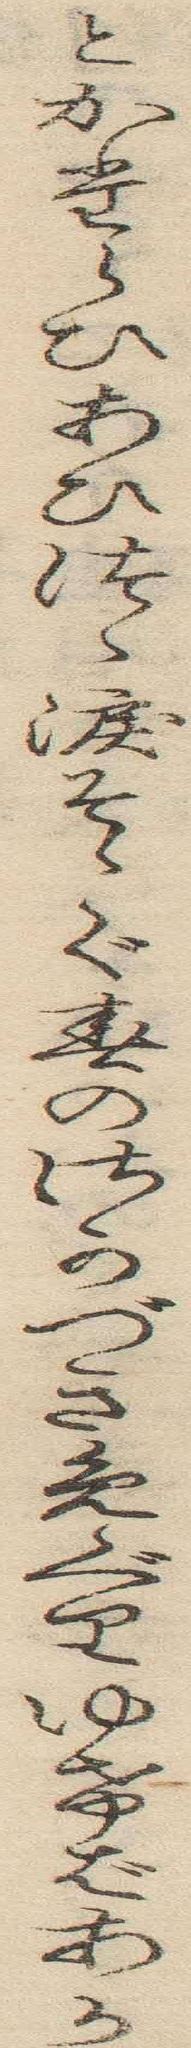とかたらひあひつゝ涙そゝぐ春のさかづきめぐりゆけばあか
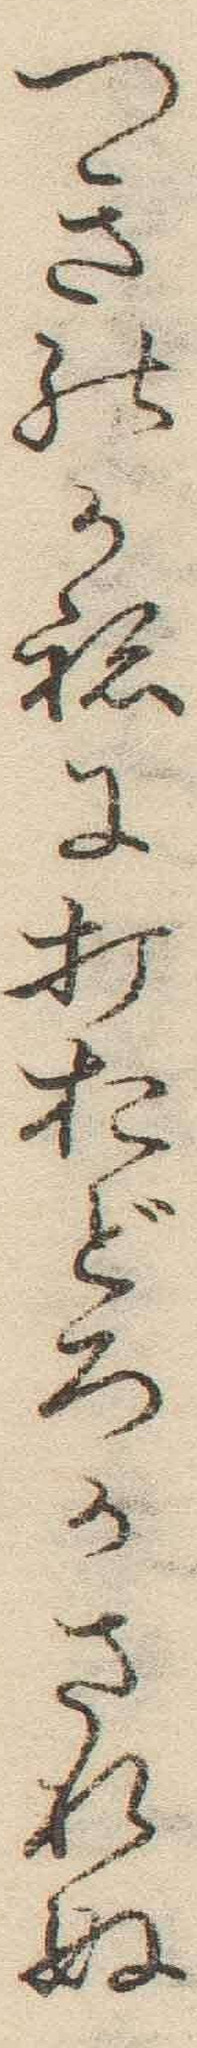つきのかねに打おどろかされぬ
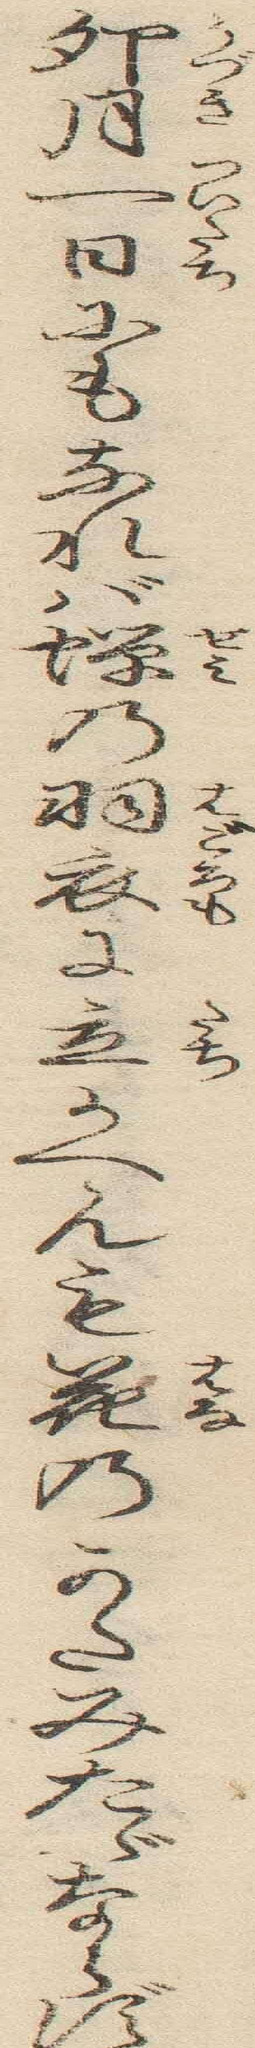夘月一日にもなれば蝉の羽衣に立かへんも花のかたみたゞならず
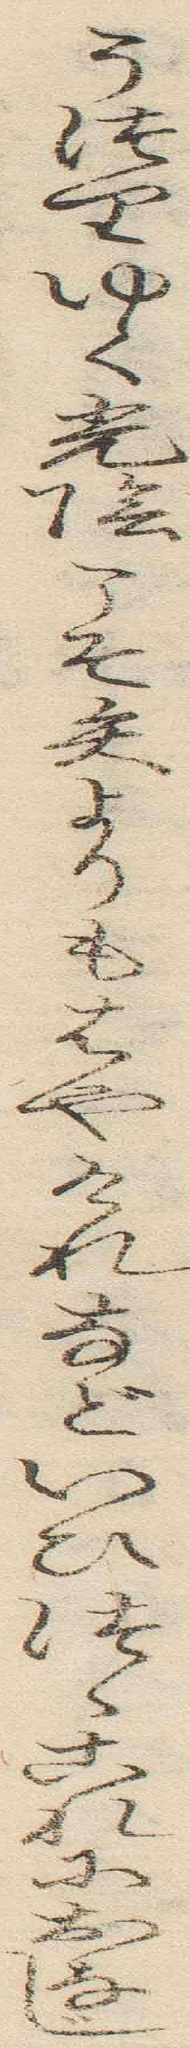うつりゆく光陰こそ矢よりもはやけれなどいひつゝこれにおなじ
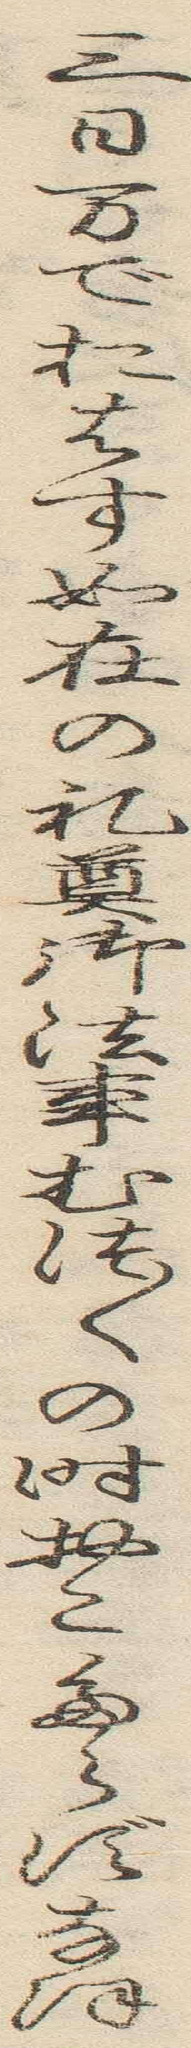三日までおはす如在の礼奠御法事むつ〳〵の时おこたらずなほ
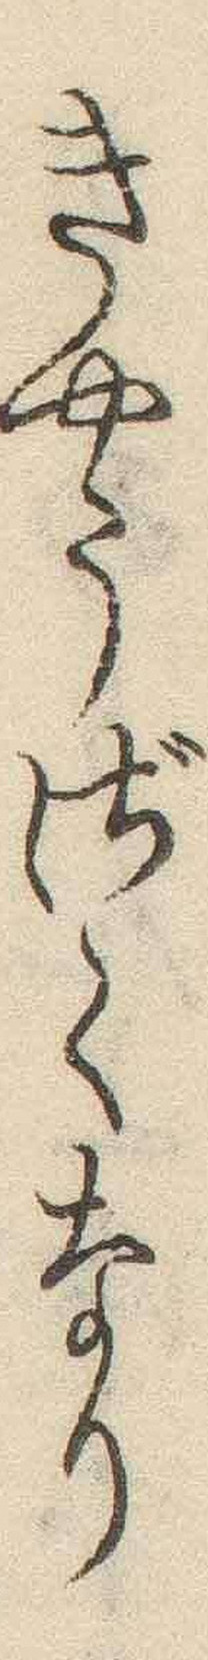きやうざくなり
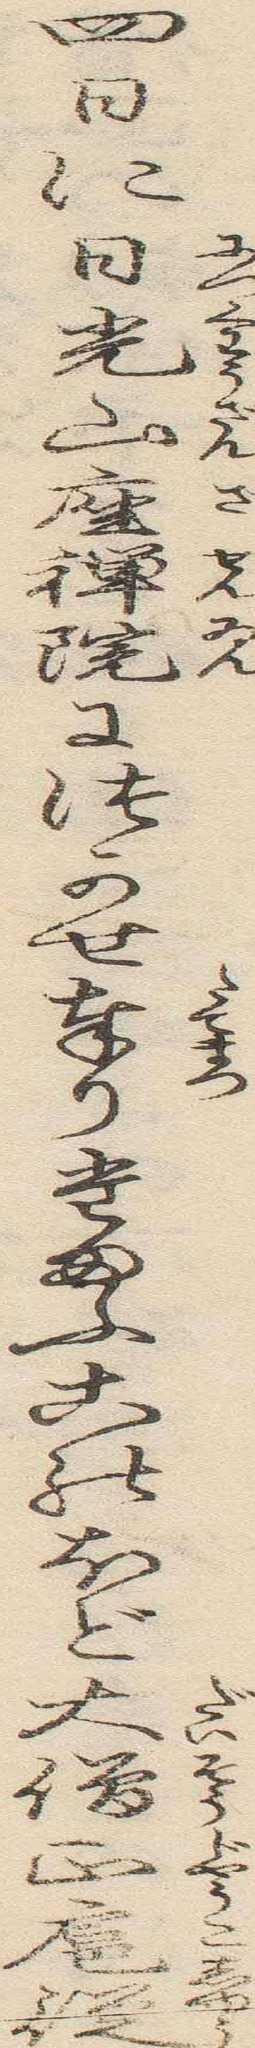四日に日光山座禅院につかせ奉りたまふこのほど大僧正扈従
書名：日光山志
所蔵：東京学芸大学附属図書館 国文学研究資料館
